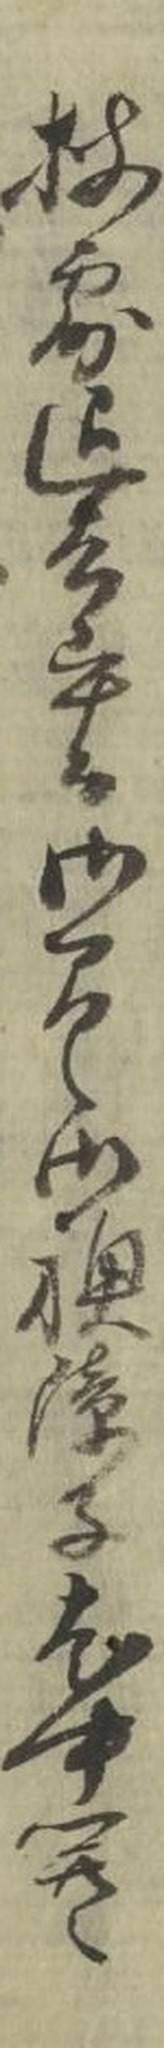披露退去畢て御間之御襖障子老中開之
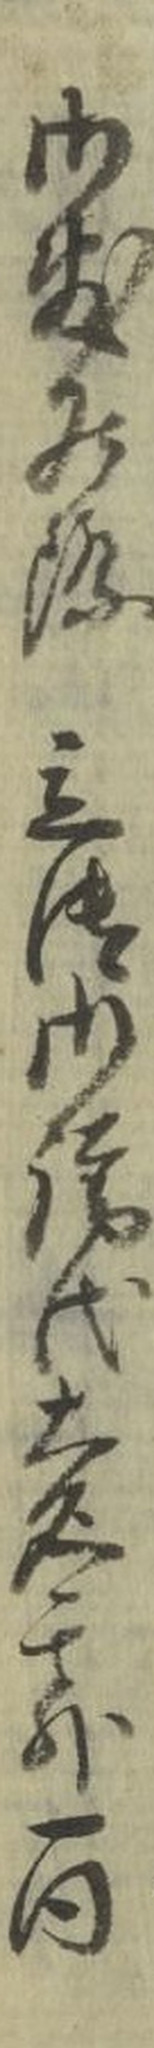御敷居際立御御譜代大名其外一同
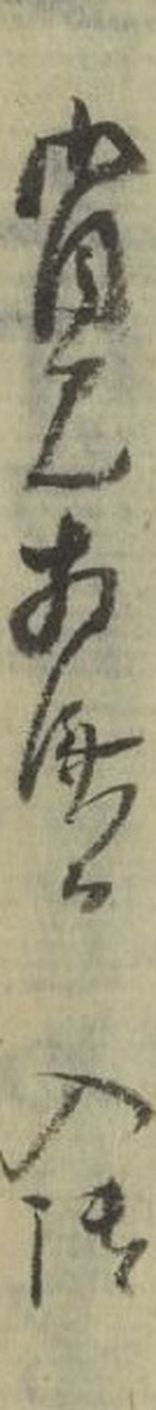御目見相済而入御

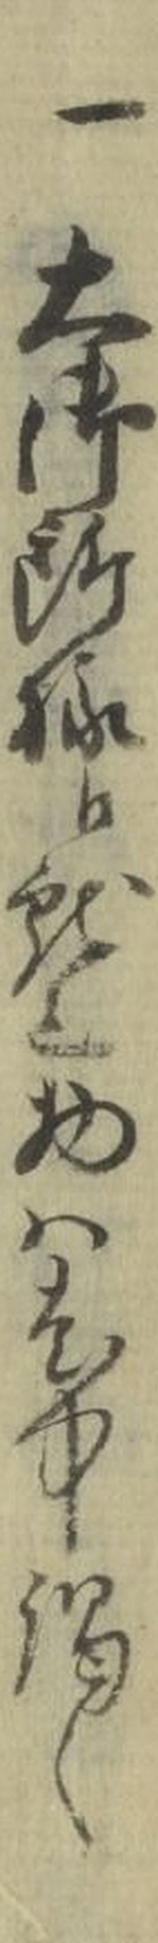一大御所様え献上物は老中謁之
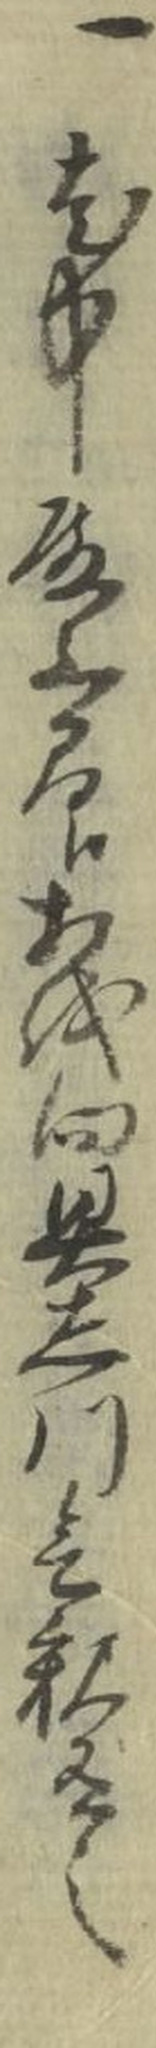一老中殿上間え相越向具志川会釈有之
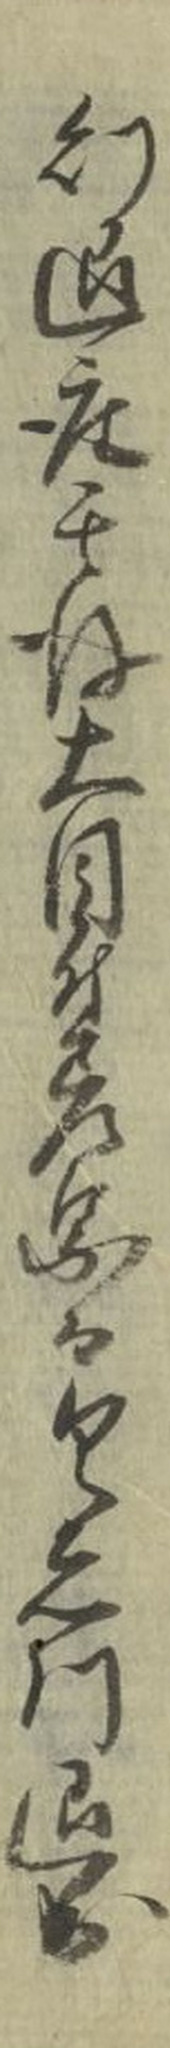則退座其後大目付差図而具志川退出
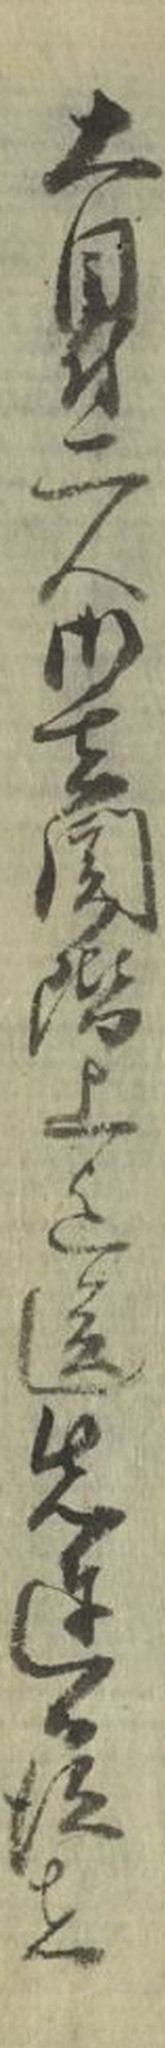大目付二人御玄関階上迄送先達て従者
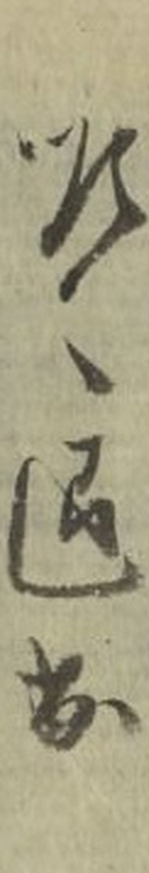順々退出
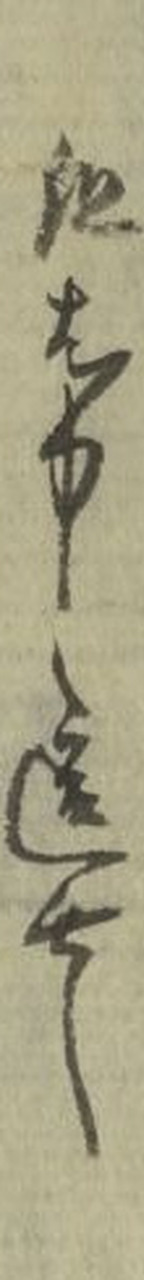但老中之送無之
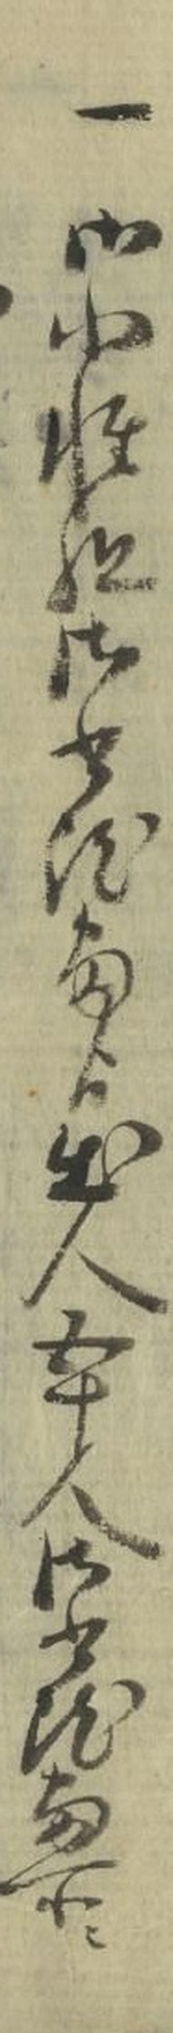一御小性組御書院番ゟ出人五十人御書院番所に
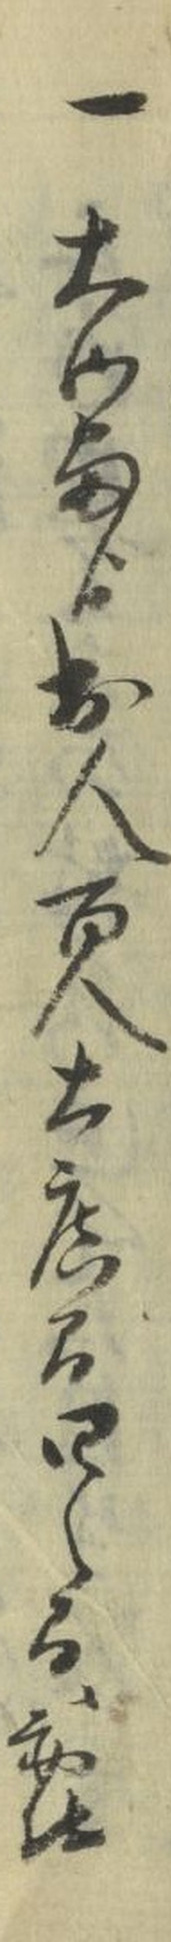一大御番ゟ出人百人大広間四之間に勤仕
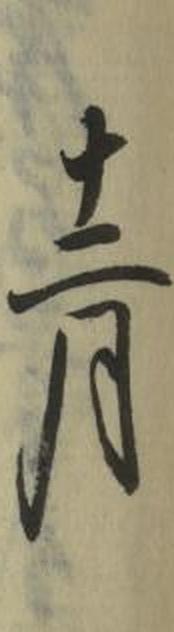十二月
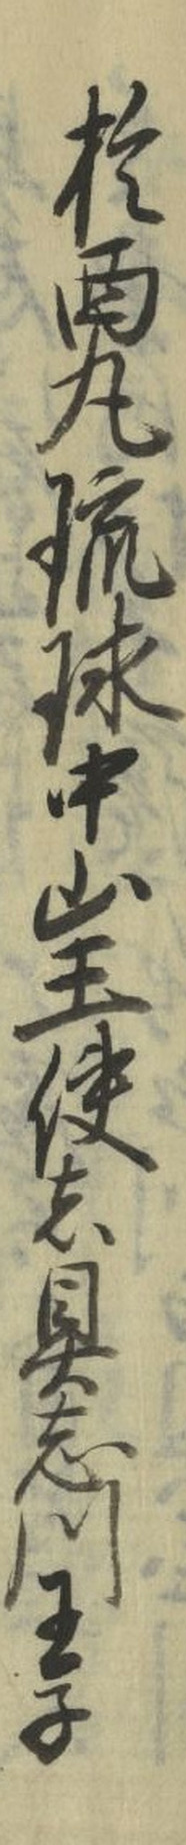於西丸琉球中山王使者具志川王子
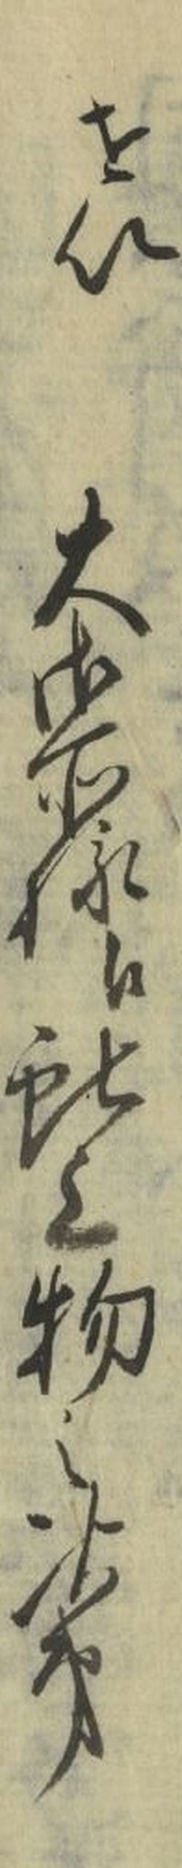を以大御所様え献上物之次第
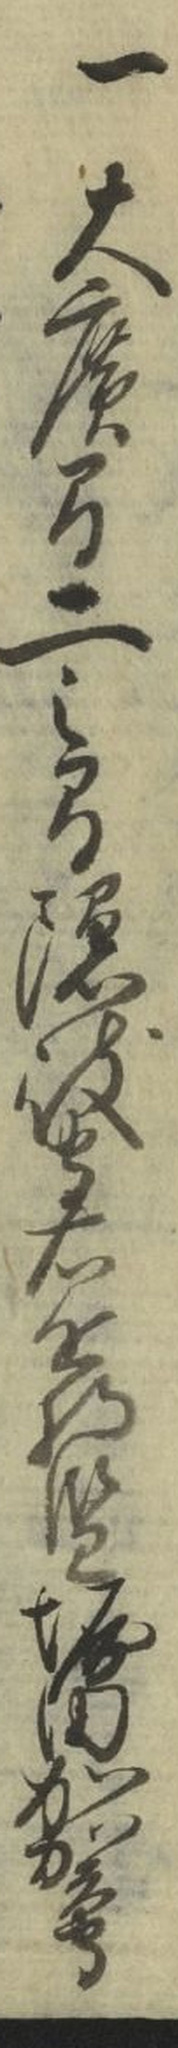一大広間二之間隠岐守右近将監堀田加賀守
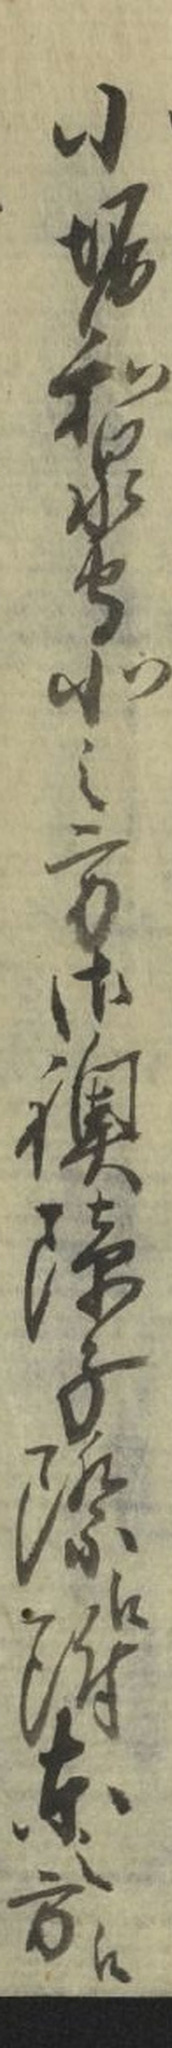小堀和泉守北之方御襖障子際え附東之方え
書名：戊辰琉球人来朝之式 全
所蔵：University of the Ryukyus Library
